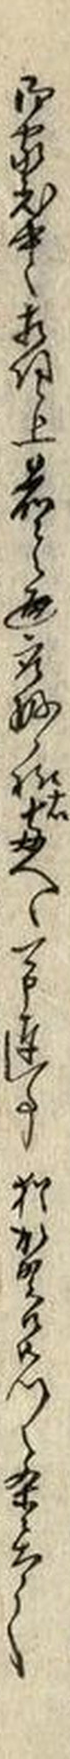御家老中へ相伺候上前々之通取扱候様右両人へ可申達事猶加賀口御門之条ニ出之
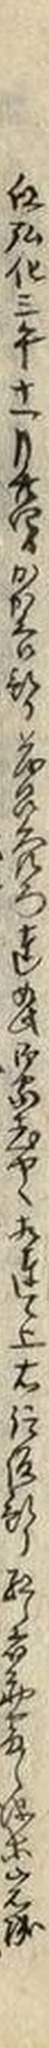但弘化三午十一月廿四日加賀口預り茂呂久左衛門達如此御家老中へ相達候上右跡仮預り組之者勤番之儀等岩城
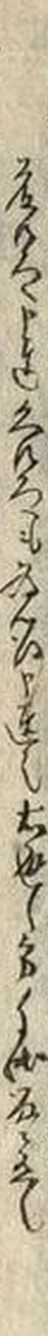藤左衛門へ申達久左衛門へも為心得申達之右通し方手紙留ニ有之
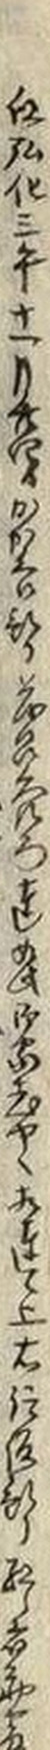但弘化三午十一月廿四日加賀口預り茂呂久左衛門達如此御家老中へ相達候上右跡仮預り組之者勤番之儀等岩城
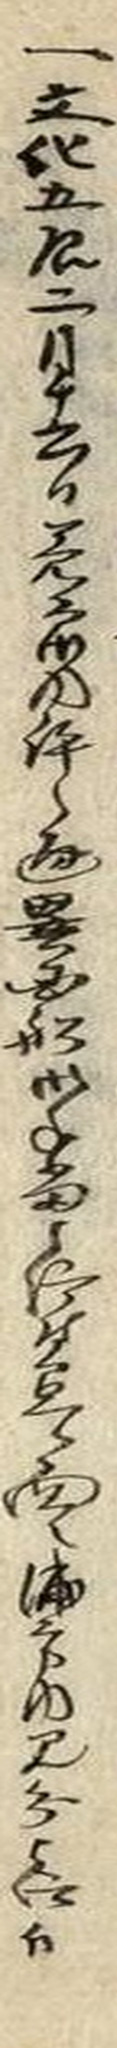一文化五辰二月十六日兼而御内許之通異国船御手当被仰付置候面々浦方内見分被仰付
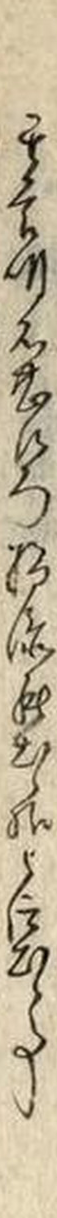其節明石甚左衛門指添罷出候様被仰出候事
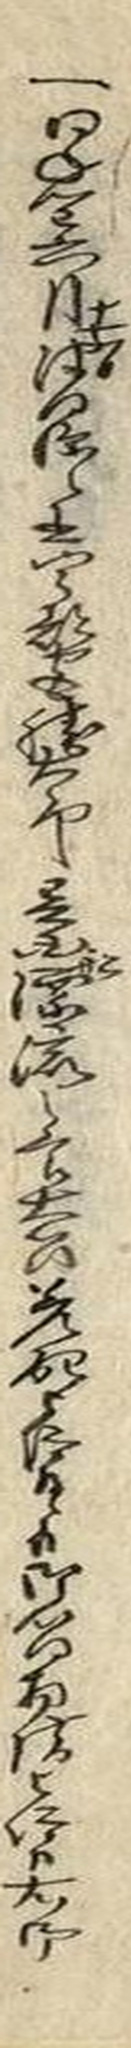一同年閏六月十七日津田源之丞宇都宮勝太郎異国船漂流之節大筒差配被仰付候ニ付御筒拝借被仰付右御
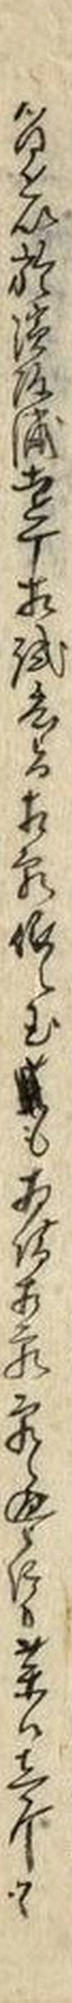筒を以御於浜坂浦遠丁相試度旨相願銀之玉も拝借相願願之通被仰付薬ハ壱斤ツヽ
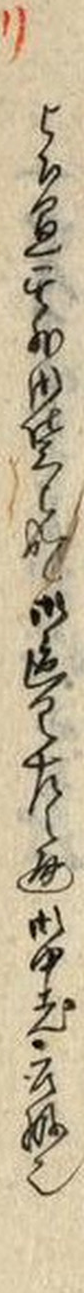被下置其外御貸被成候御道具左之通御中老取扱也

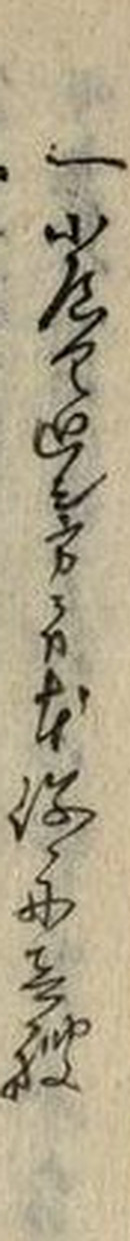一小道具廻シ方ニ付本役舟壱艘
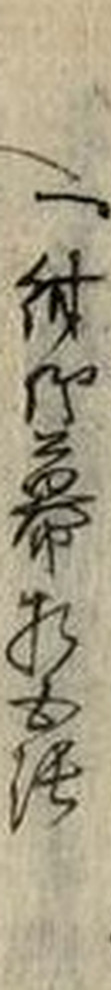一紺御幕拾五張
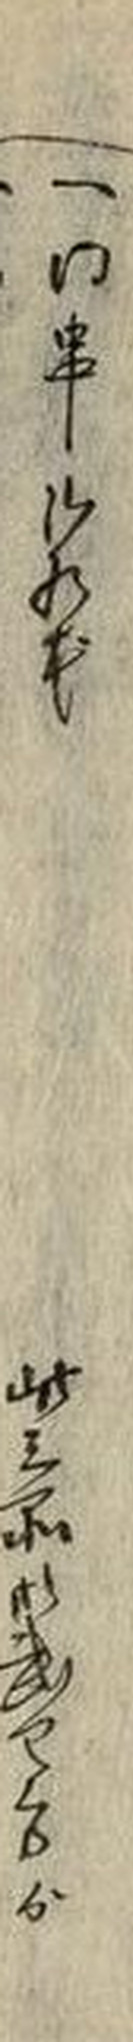一同串弐拾本此三品御武具方ゟ
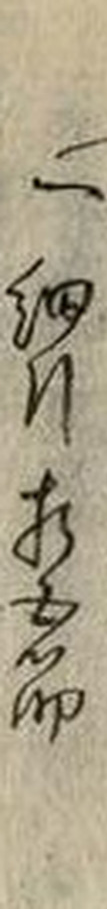一細引拾五筋
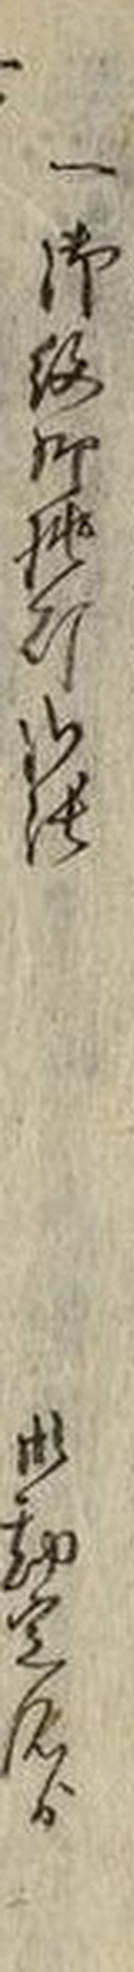一御紋御提灯弐張御勘定所ゟ
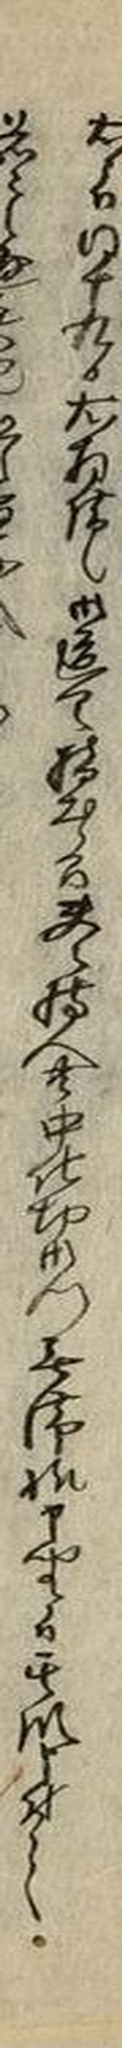右ニ付同十九日右拝借候御道具指出候間夫々持人共中仕切御門無滞様申聞ニ付其段申付之
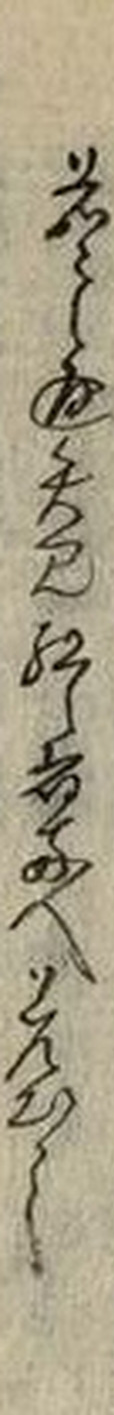前々之通矢見組之者両人差出之
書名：御国他国諸事之部
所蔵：福井県文書館 Fukui Prefectural Archives
